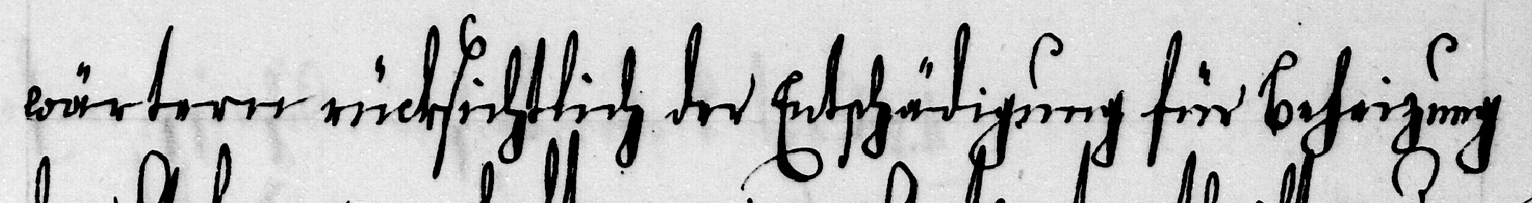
wärtern rücksichtlich der Entschädigung für Beheizung
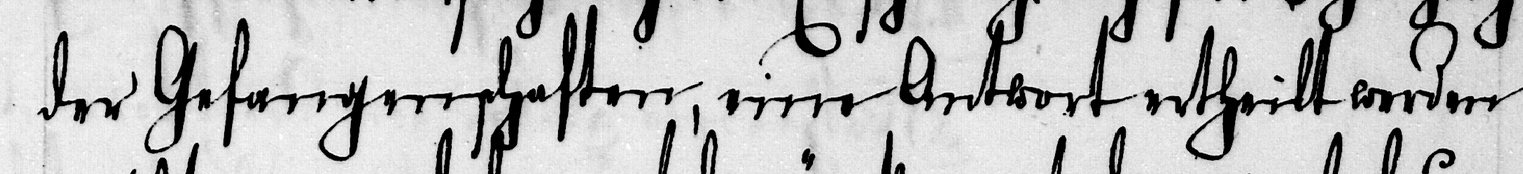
der Gefangenschaften, eine Antwort ertheilt werden
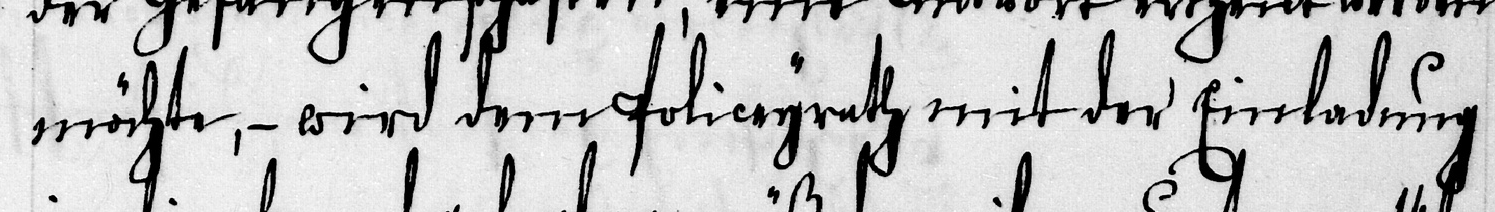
möchte, – wird dem Policeyrath mit der Einladung
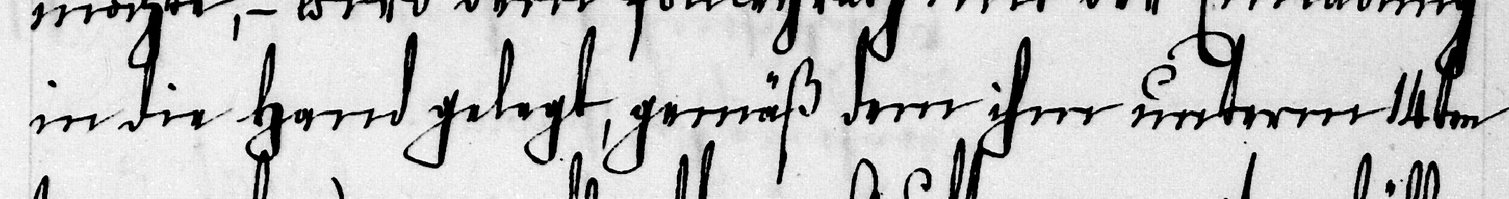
in die Hand gelegt, gemäß dem ihm unterm 14ten
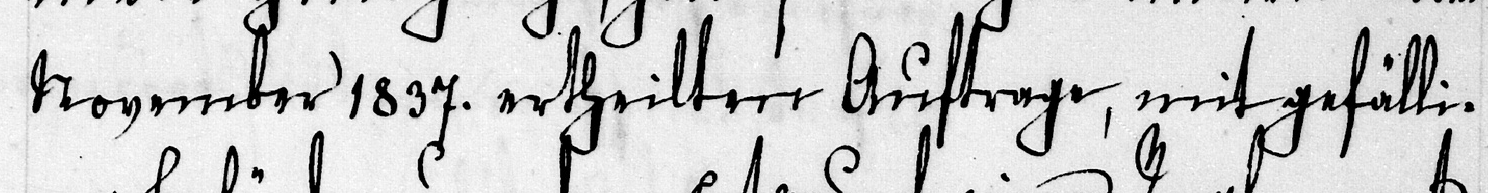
November 1837. ertheilten Auftrage, mit gefälli¬
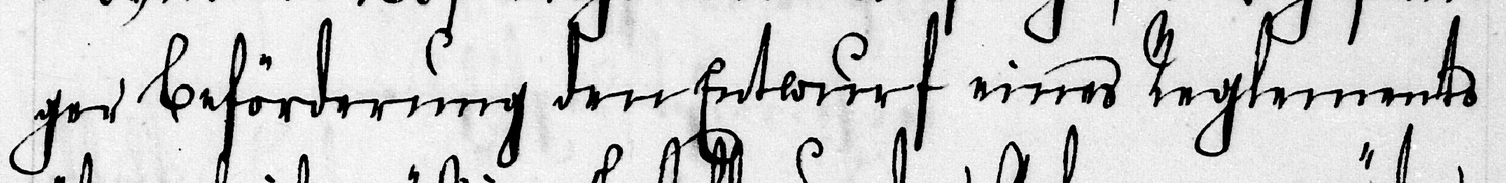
ger Beförderung den Entwurf eines Reglements
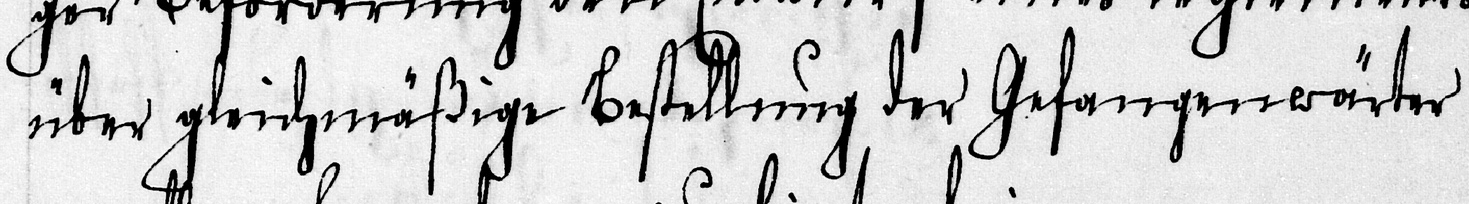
über gleichmäßige Bestellung der Gefangenwärter
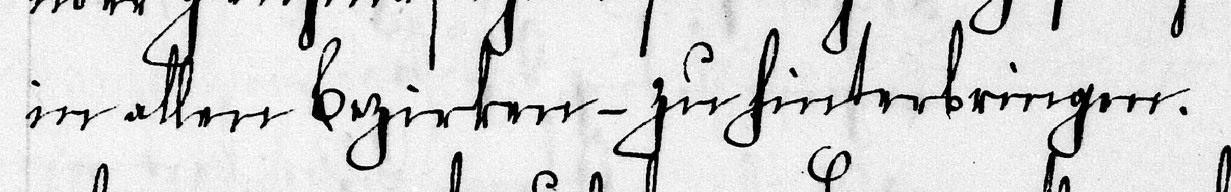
in allen Bezirken – zu hinterbringen.
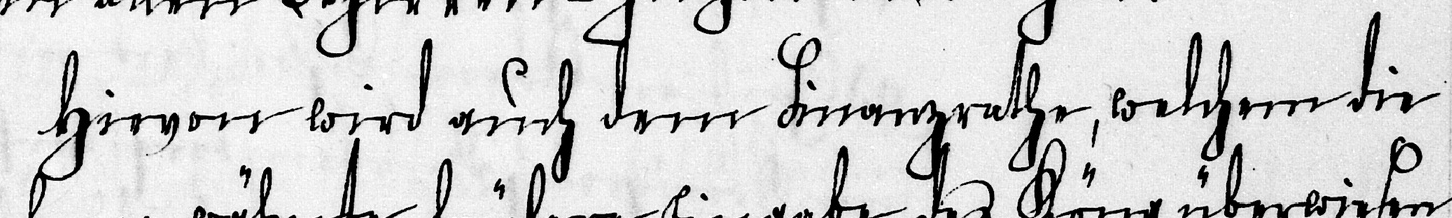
Hievon wird auch dem Finanzrathe, welchem die
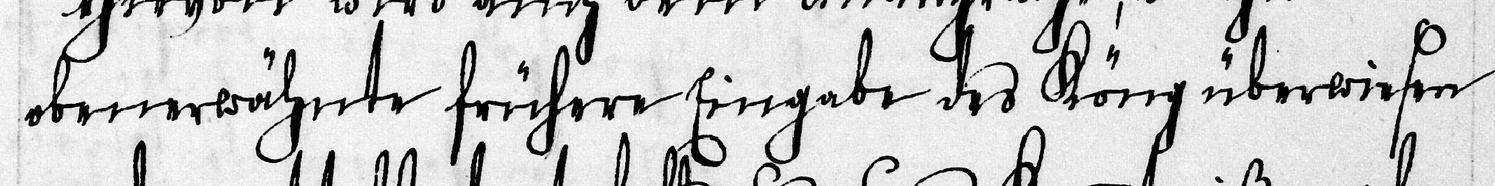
obenerwähnte frühere Eingabe des Köng überwiesen
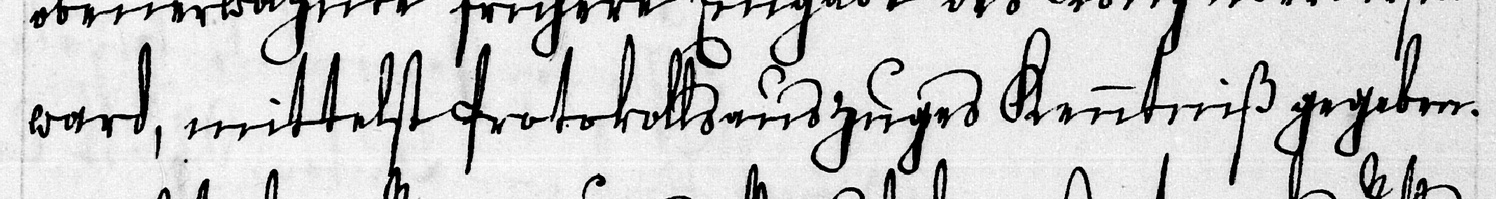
ward, mittelst Protokollsauszuges Kenntniß gegeben.
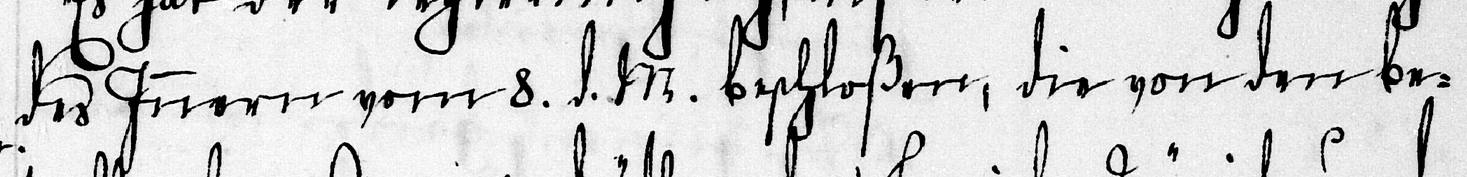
des Innern vom 8. d. M. beschloßen, die von den be¬
